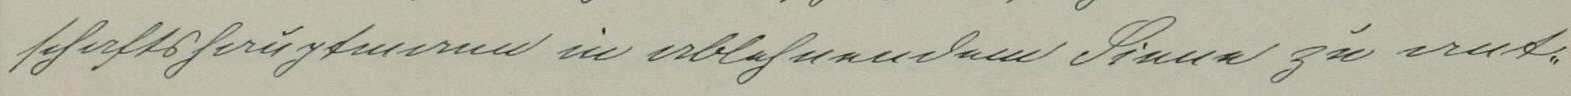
schaftshauptmann in ablehnendem Sinne zu ant-
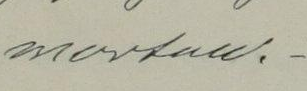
worten.
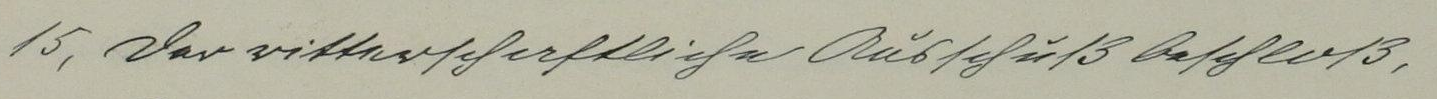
15. Der ritterschaftliche Ausschuß beschloß,
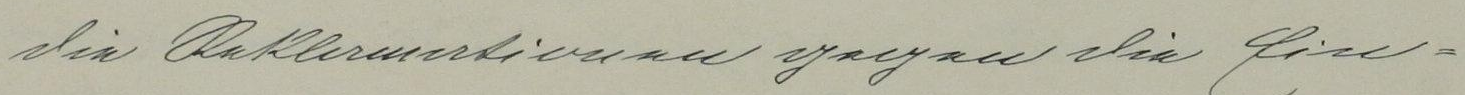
die Reklamationen gegen die Ein-
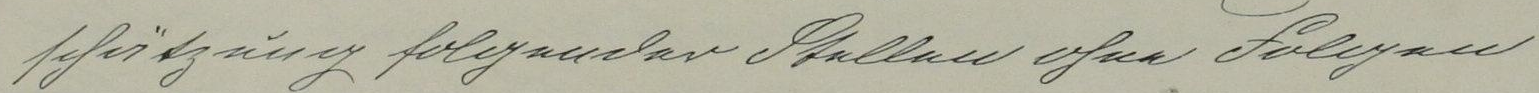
schätzung folgender Stellen ohne Folgen
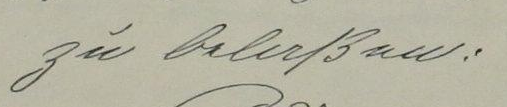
zu belaßen:
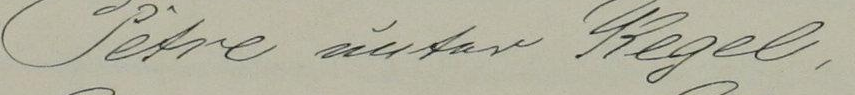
Petre unter Kegel,
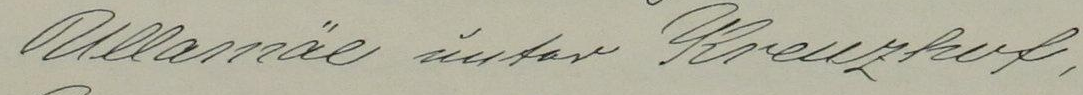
Ullamäe unter Kreuzhof,
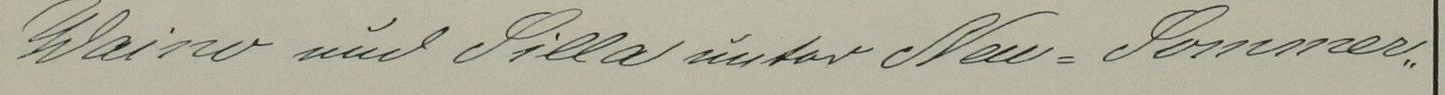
Waino und Silla unter Neu-Sommer-
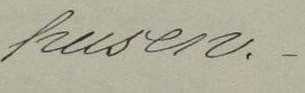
husen.
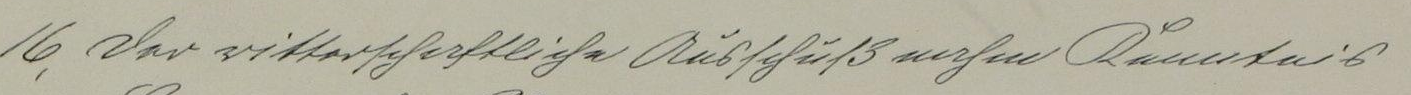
16. Der ritterschaftliche Ausschuß nahm Kenntnis
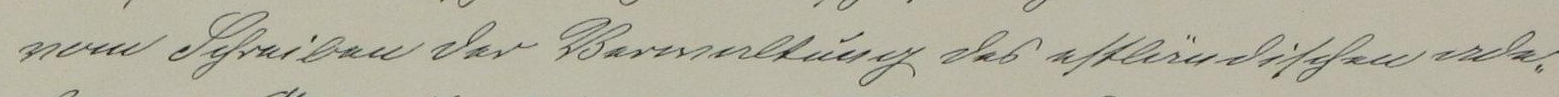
vom Schreiben der Verwaltung des estländischen ade-
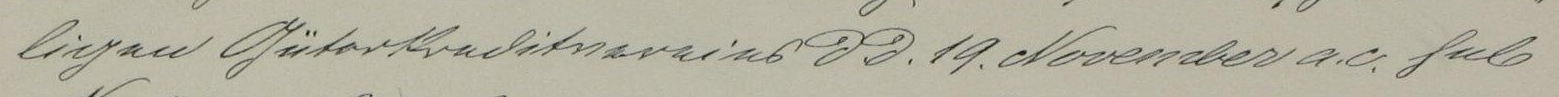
ligen Güterkreditvereins d.d. 19. November a.c. sub
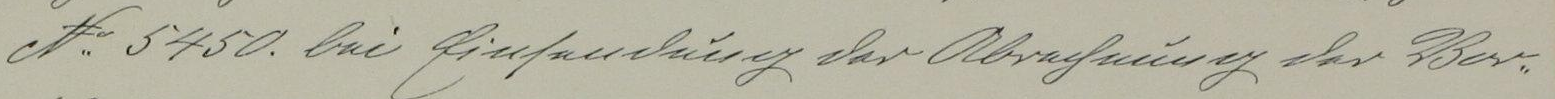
No. 5450. bei Einsendung der Abrechnung der Vor-
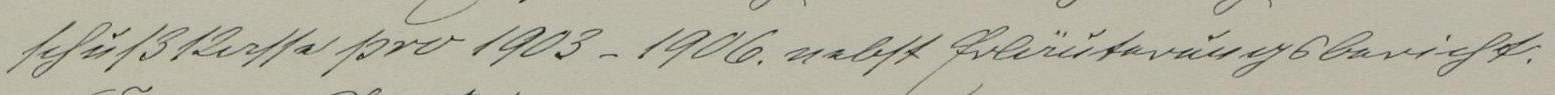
schußkasse pro 1903-1906. nebst Erläuterungsbericht.
